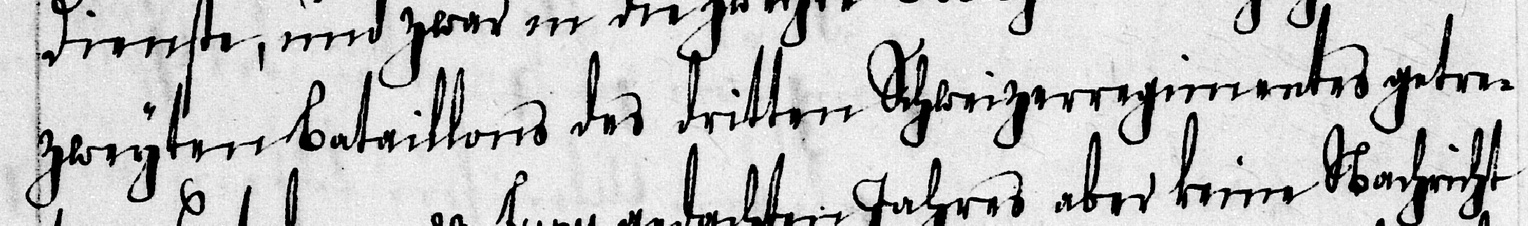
zweyten Bataillons des dritten Schweizerregimentes getre¬
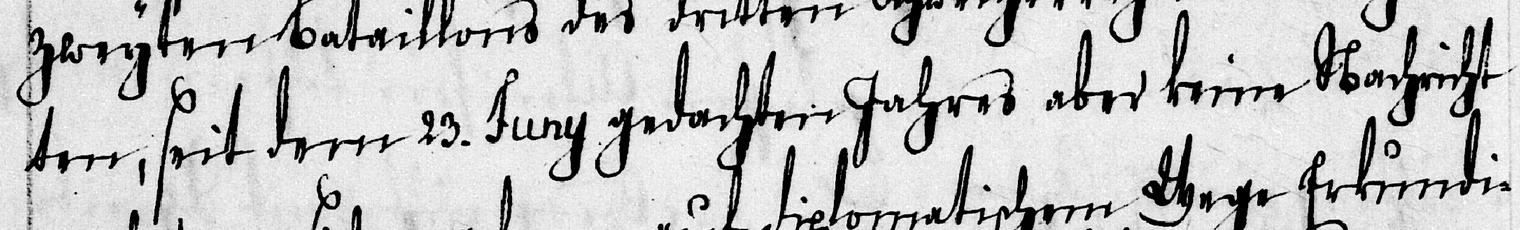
ten, seit dem 23. Juny gedachten Jahres aber keine Nachricht
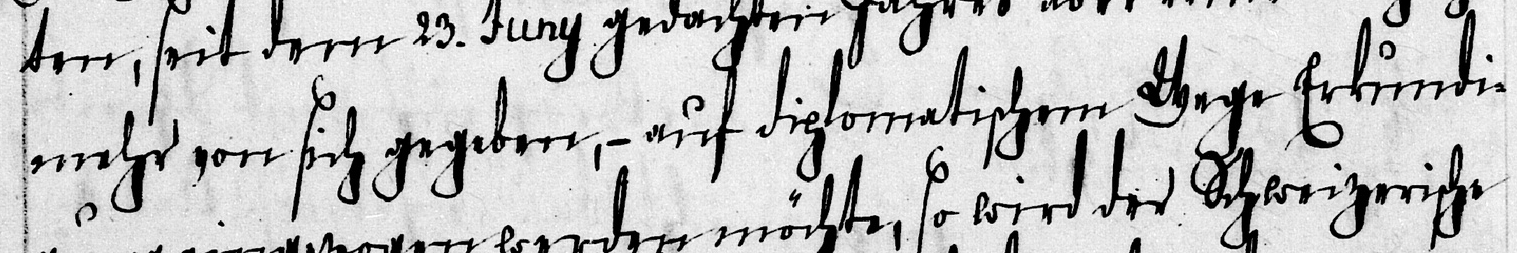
mehr von sich gegeben, – auf diplomatischem Wege Erkundi¬
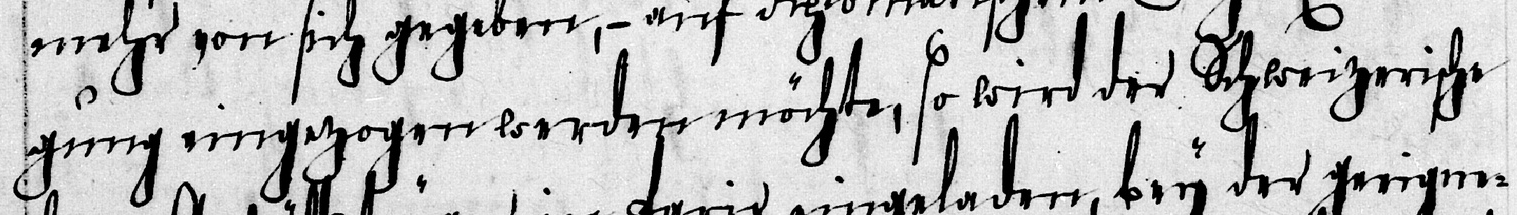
gung eingezogen werden möchte, so wird der Schweizerische
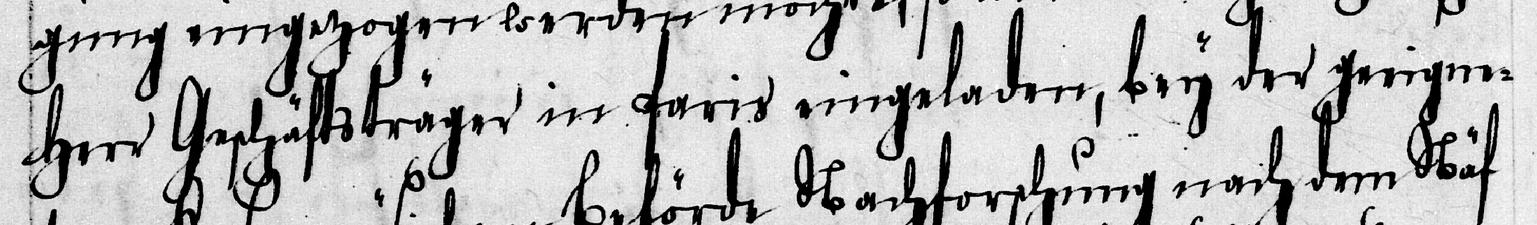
Herr Geschäftsträger in Paris eingeladen, bey der geeigne¬
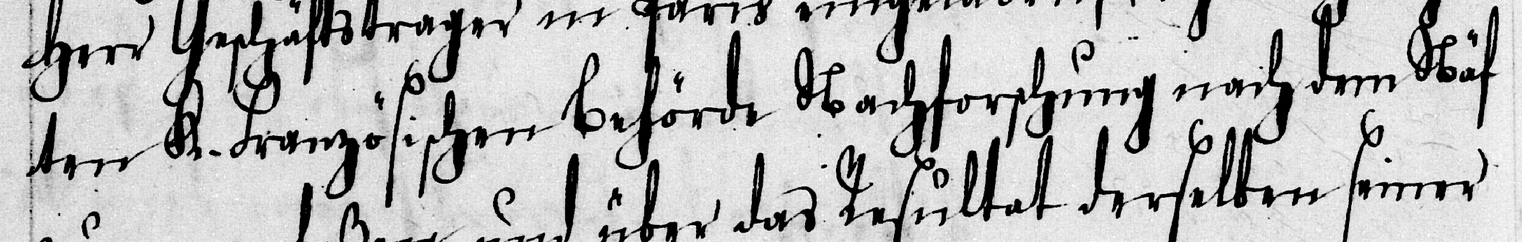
ten K. Französischen Behörde Nachforschung nach dem Näf
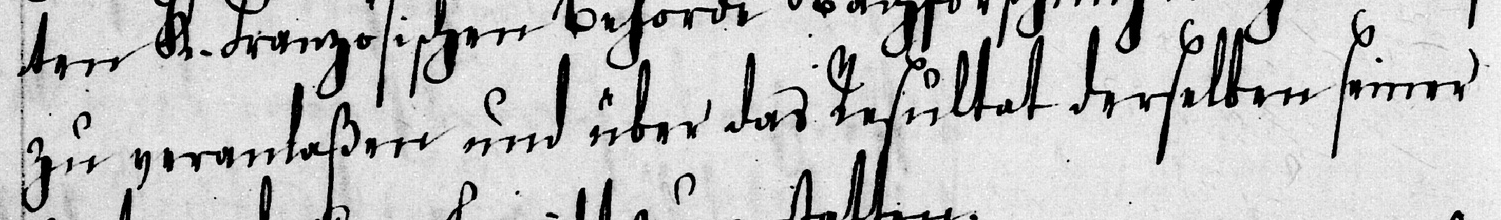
zu veranlaßen und über das Resultat derselben seiner
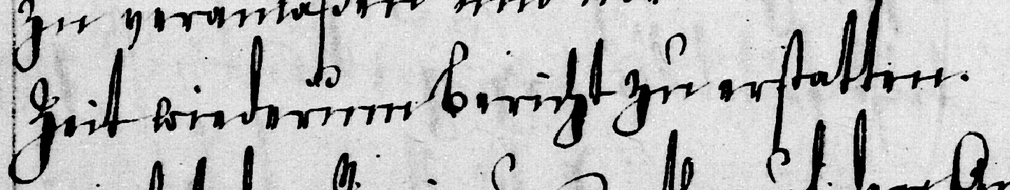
Zeit wiederum Bericht zu erstatten.
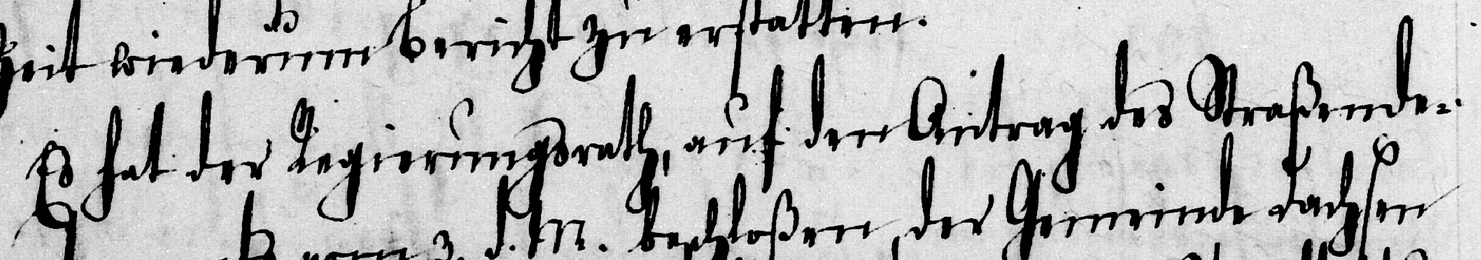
Es hat der Regierungsrath, auf den Antrag des Straßende¬
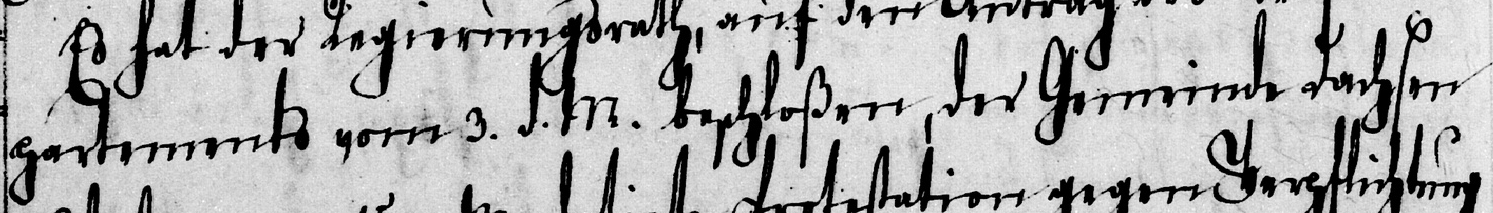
partements vom 3. d. M. beschloßen, der Gemeinde Dachsen
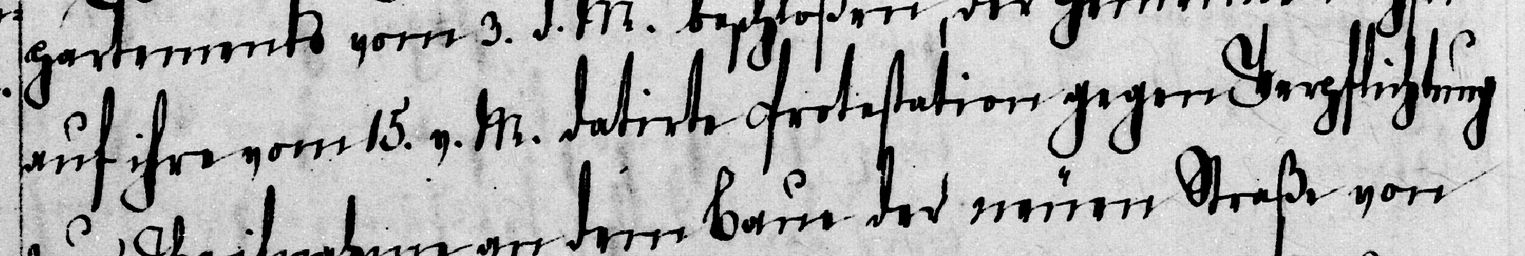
auf ihre vom 15. v. M. datirte Protestation gegen Verpflichtung
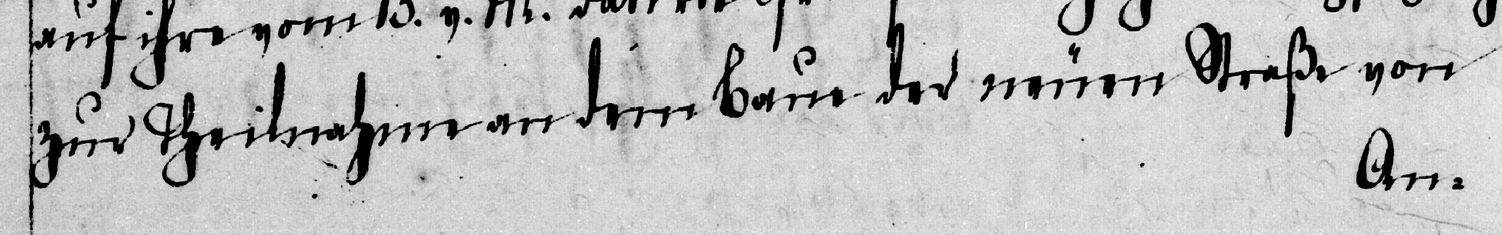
zur Theilnahme an dem Baue der neuen Straße von
